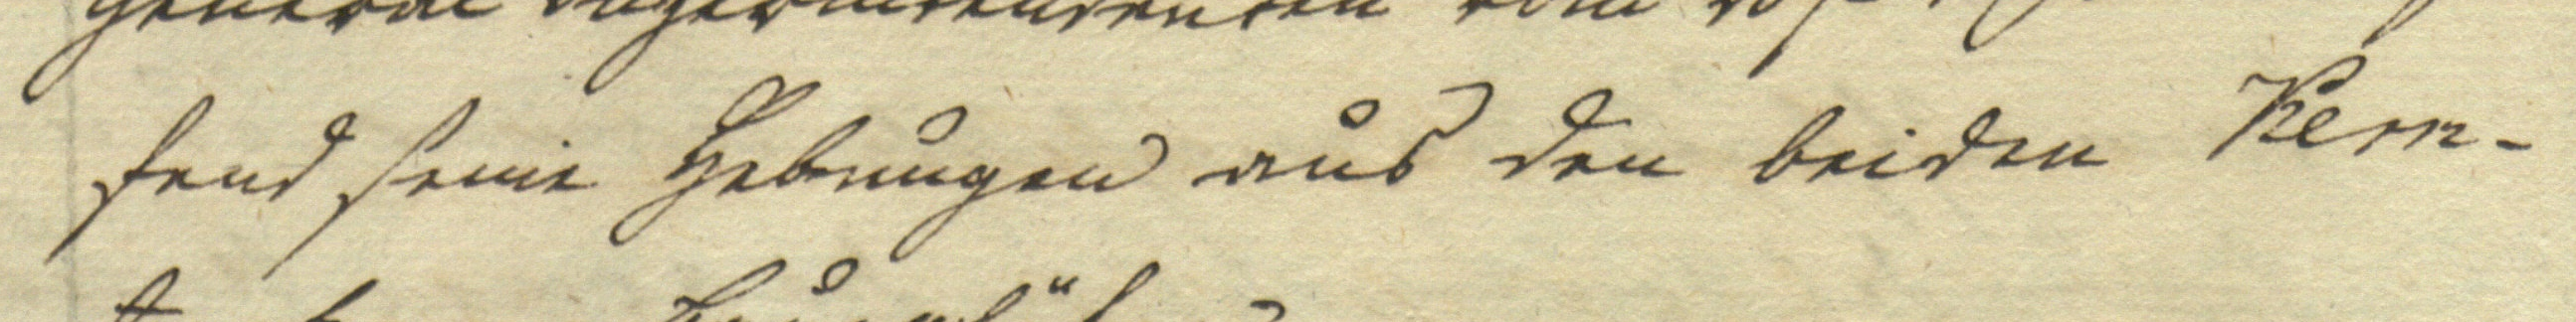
fend seine Hebungen aus den beiden Kem¬
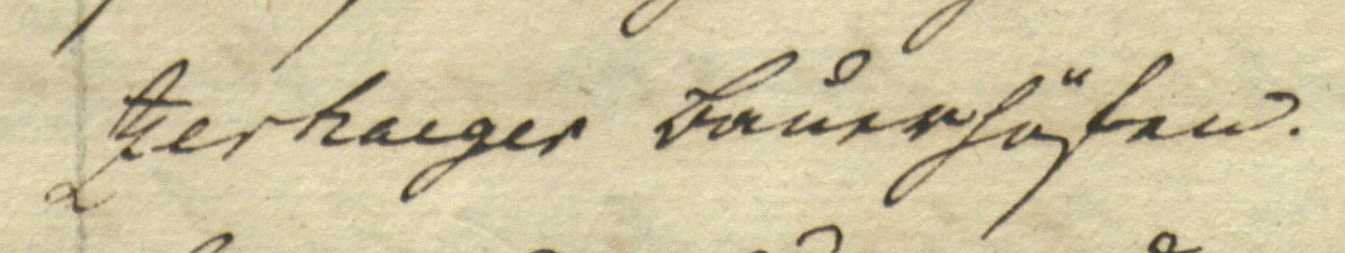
tzerhaeger Bauerhöfen.
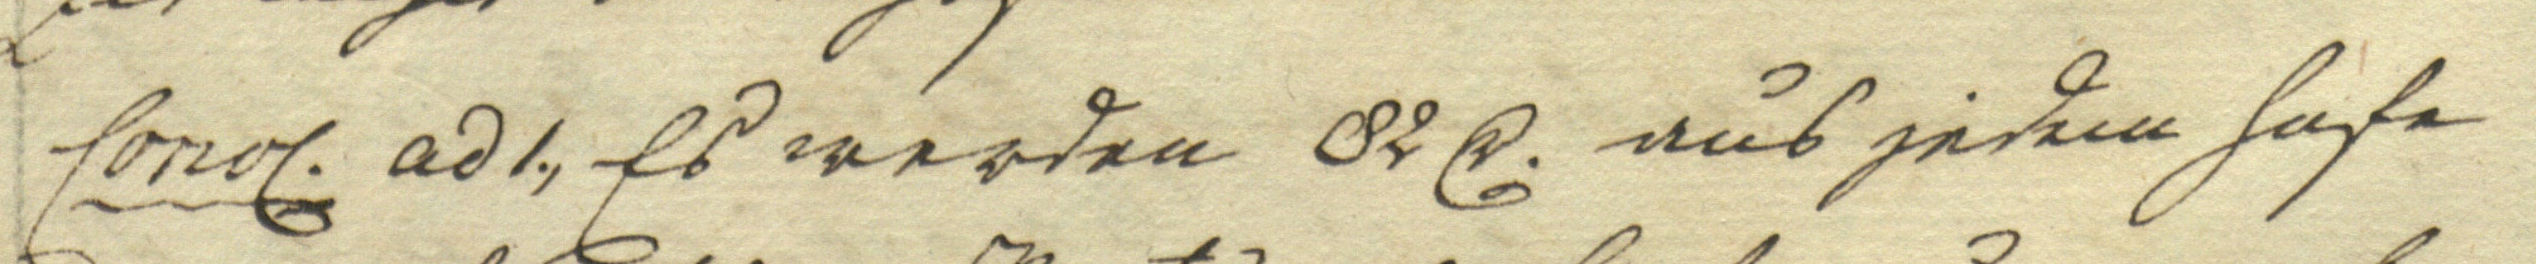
Concl. ad 1., Es werden 82 l. aus jedem Hofe
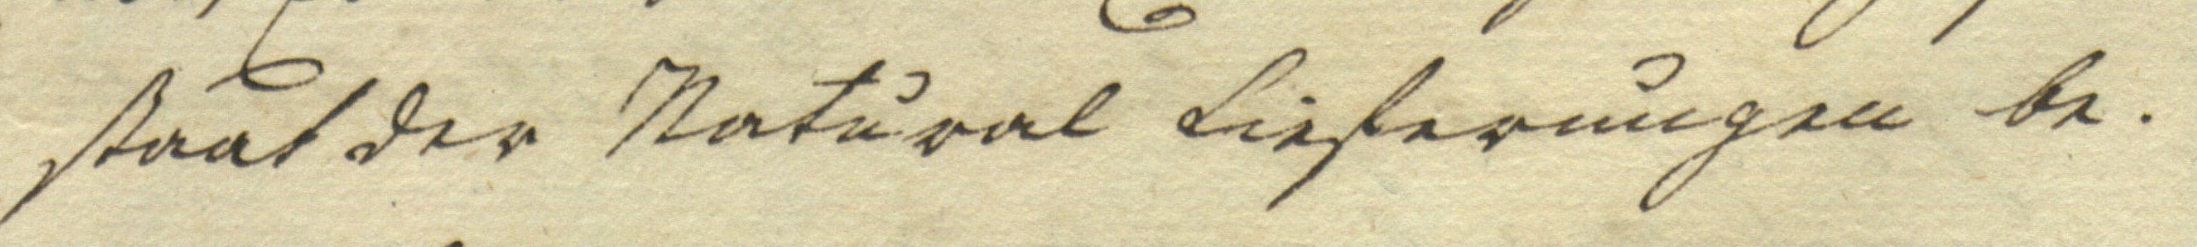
staat der Natural Lieferungen be¬
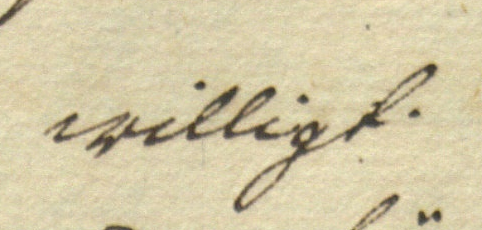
willigt.
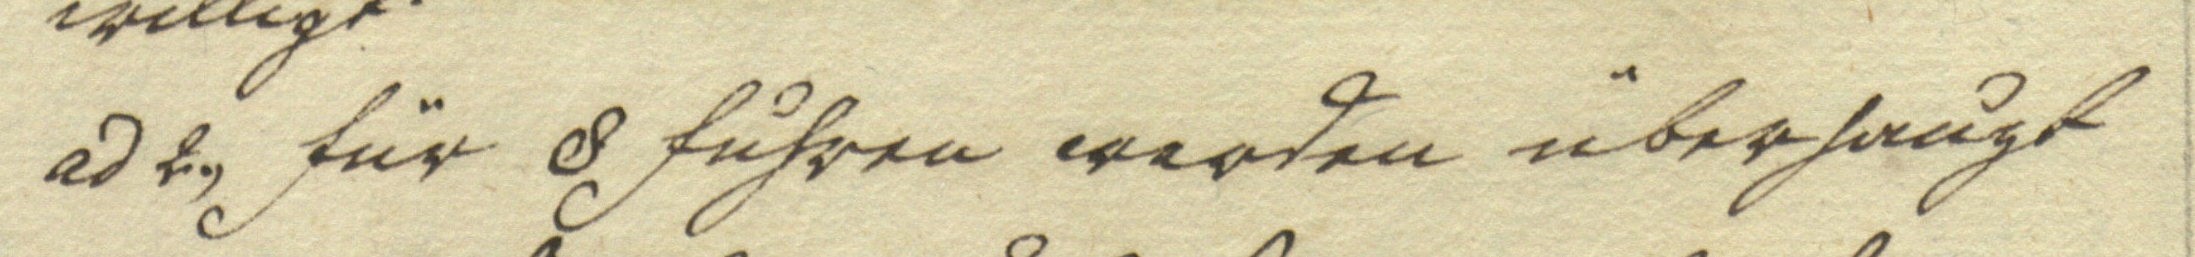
ad 2., für 8 Fuhren werden überhaupt
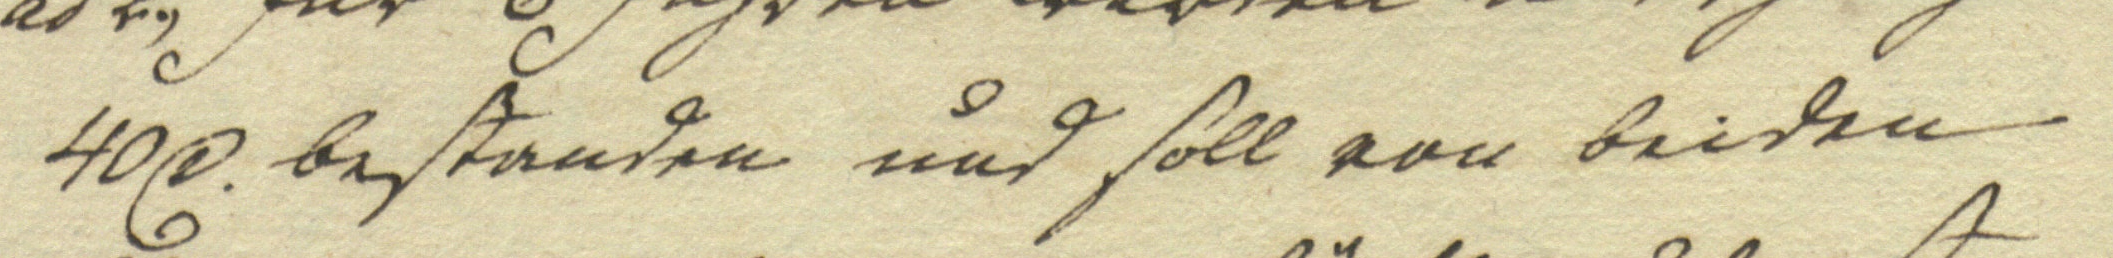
40 l. bestanden und soll von beiden
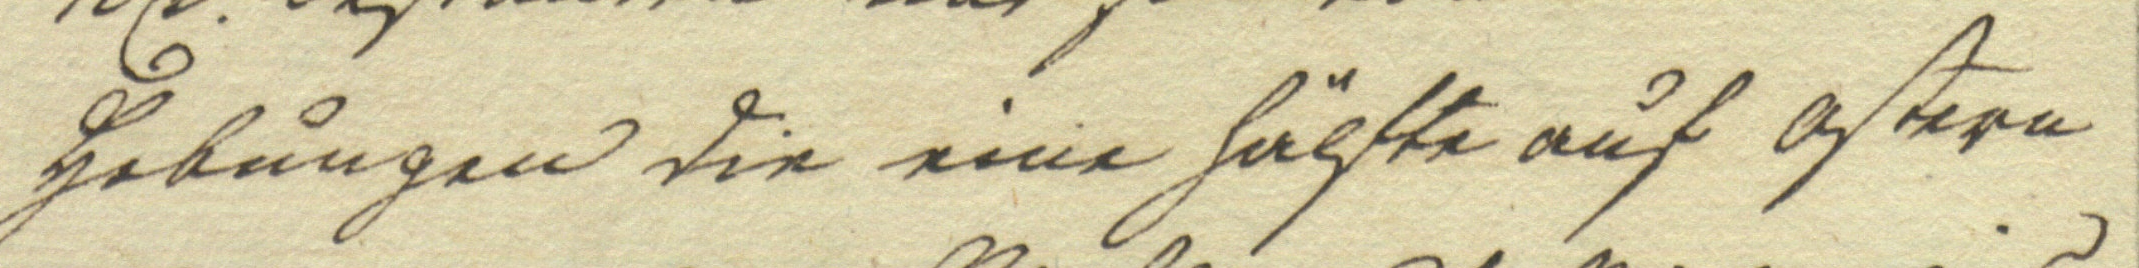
Hebungen die eine Hälfte auf Ostern
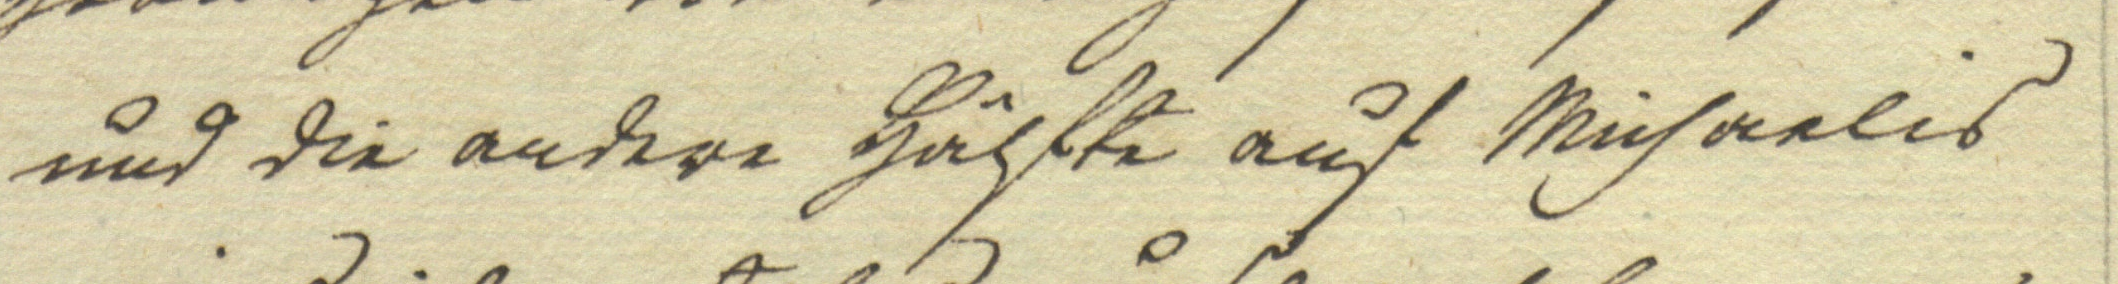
und die andere Hälfte auf Michaelis
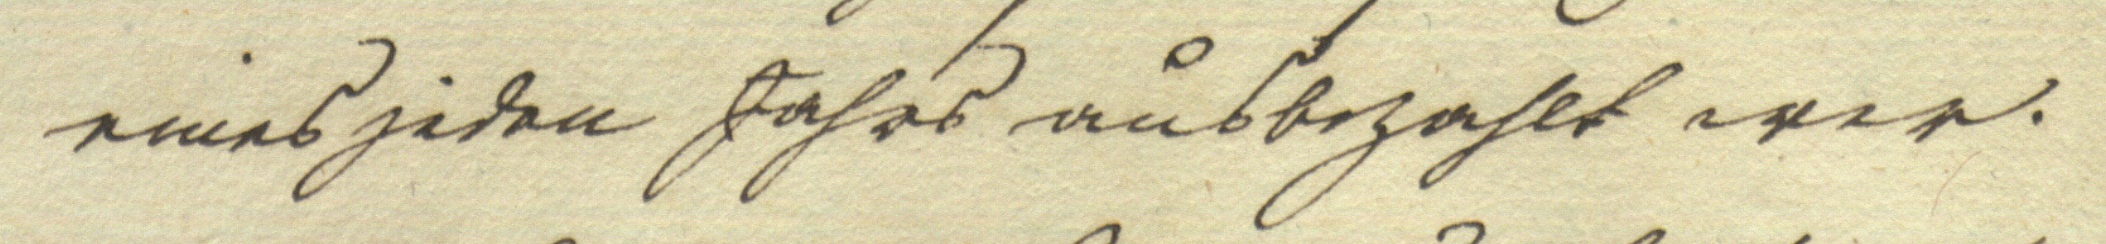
eines jeden Jahres ausbezahlt wer¬
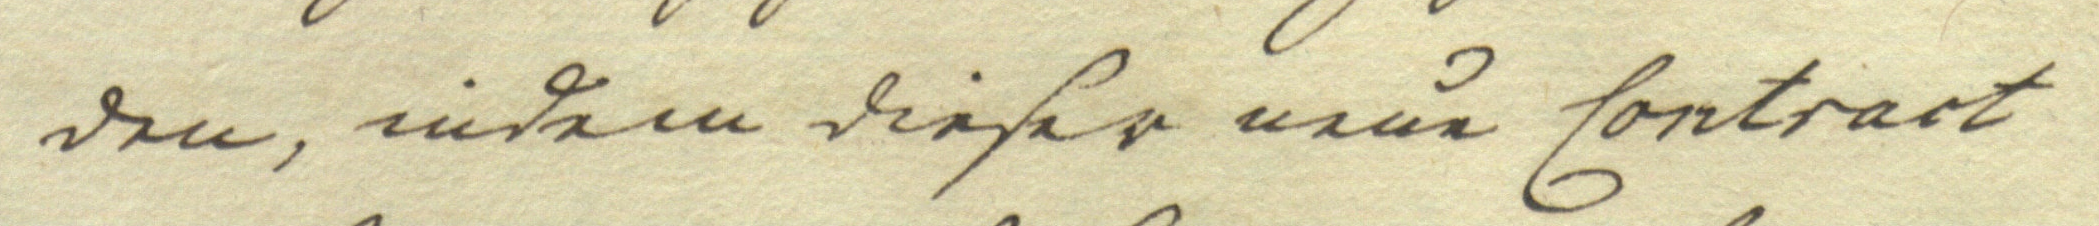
den, indem dieser neue Contract
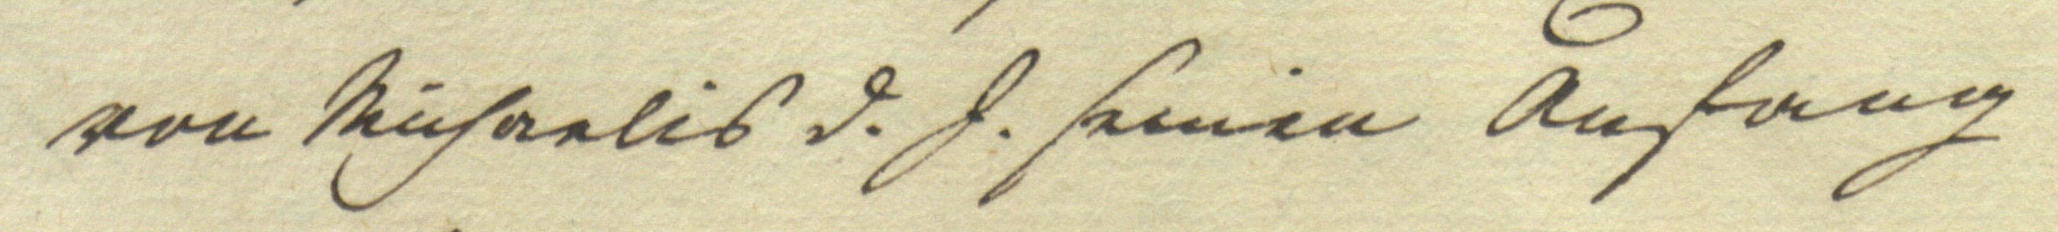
von Michaelis d. J. seinen Anfang
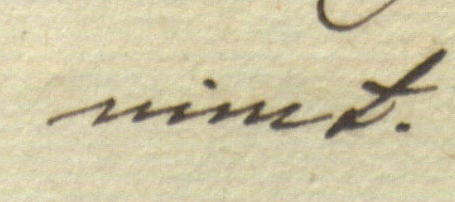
nimt.
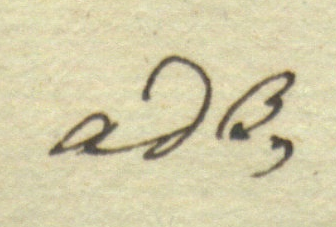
ad 3,
